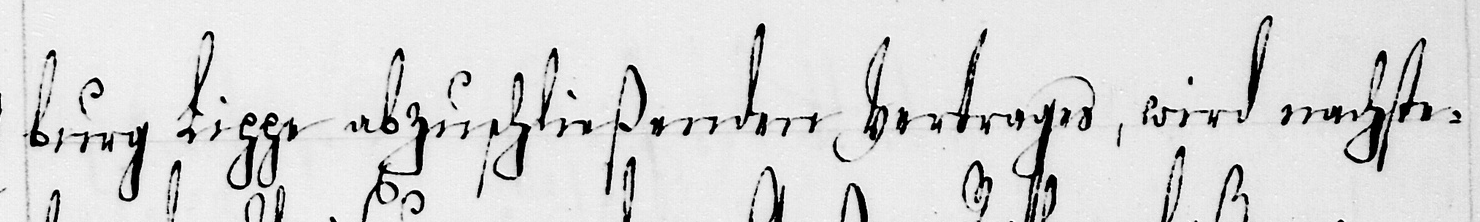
burg Lippe abzuschließenden Vertrages, wird nachste¬
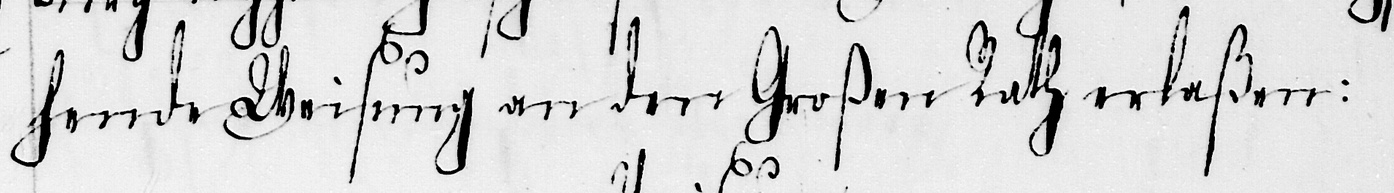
hende Weisung an den Großen Rath erlaßen:
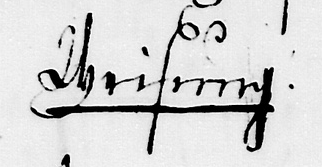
Weisung.
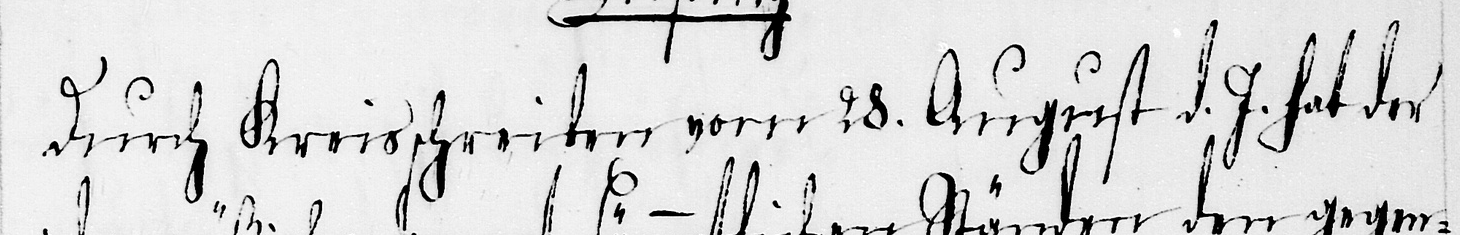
Durch Kreisschreiben vom 28. August d. J. hat der
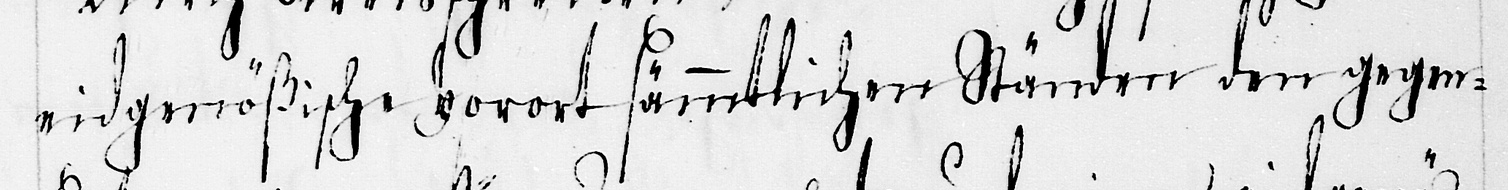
eidgenößische Vorort sämmtlichen Ständen den gegen¬
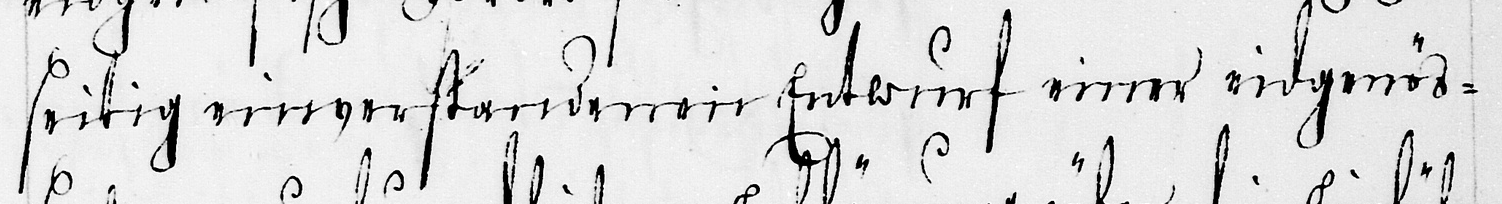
seitig einverstandenen Entwurf einer eidgenöß¬
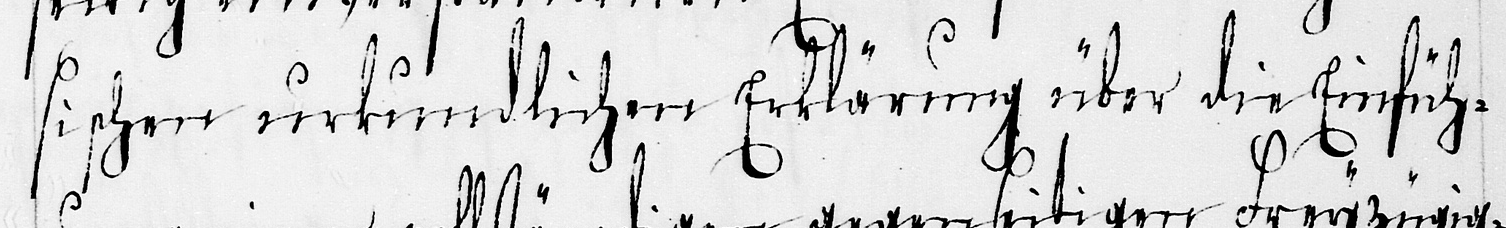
ischen urkundlichen Erklärung über die Einfüh¬
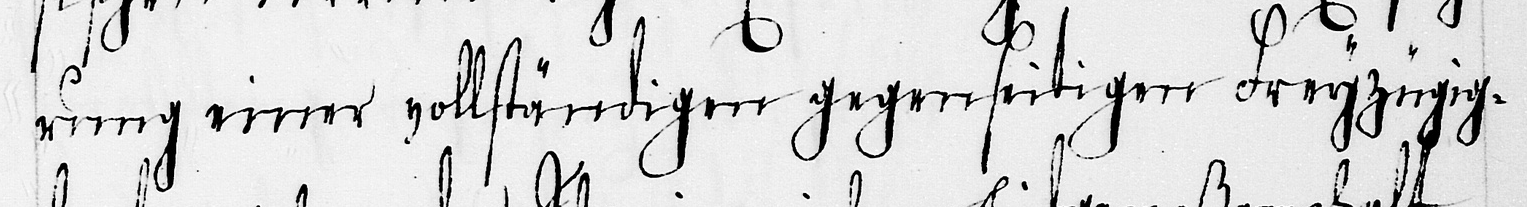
rung einer vollständigen gegenseitigen Freyzügig¬
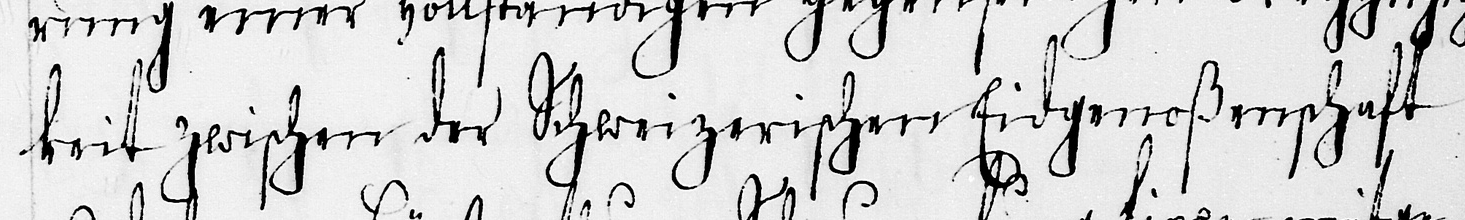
keit zwischen der Schweizerischen Eidgenoßenschaft
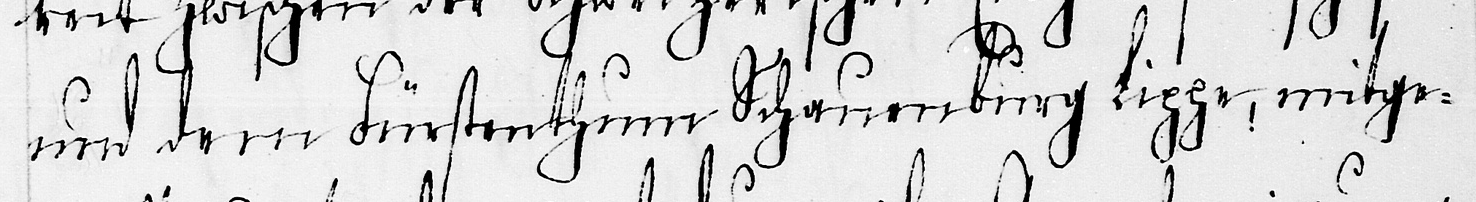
und dem Fürstenthum Schauenburg Lippe, mitge¬
